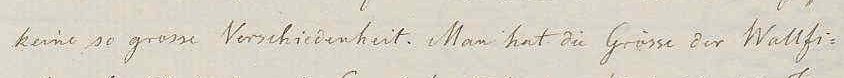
keine so grosse Verschiedenheit. Man hat die Grösse der Wallfi-
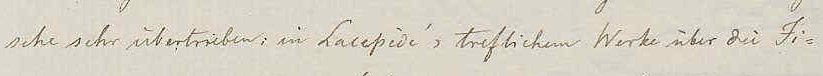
sche sehr übertrieben; in Lacepède's treflichem Werke über die Fi-
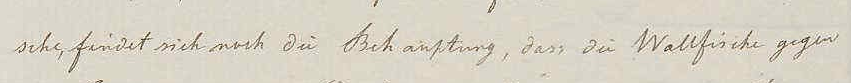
sche, findet sich noch die Behauptung, dass die Wallfische gegen
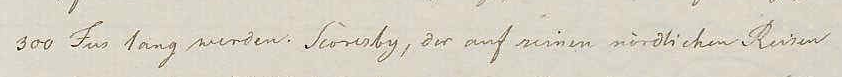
300 Fus lang werden. Scoresby, der auf seinen nördlichen Reisen
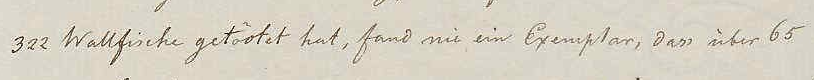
322 Wallfische getödtet hat, fand nie ein Exemplar, dass über 65
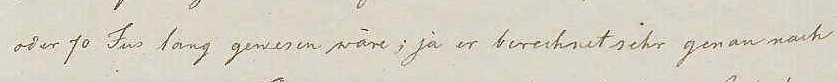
oder 70 Fus lang gewesen wäre; ja er berechnet sehr genau nach
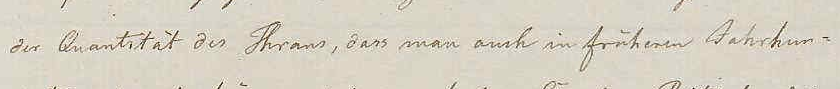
der Quantität des Thrans, dass man auch in früheren Jahrhun-
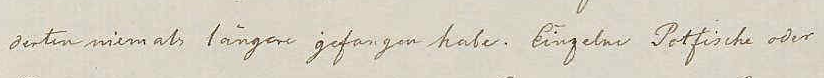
derten niemals längere gefangen habe. Einzelne Potfische oder
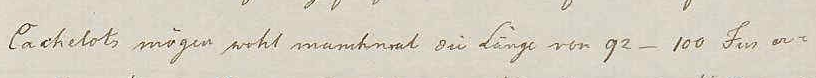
Cachelots mögen wohl manchmal die Länge von 92–100 Fus er-
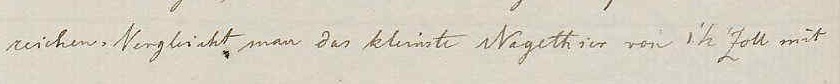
reichen. Vergleicht man das kleinste Nagethier von 1½ Zoll mit
